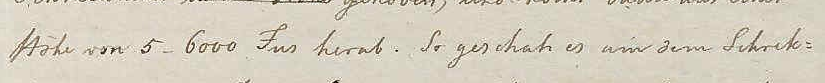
Höhe von 5–6000 Fus herab. So geschah es am dem Schrek-
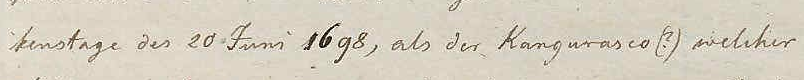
kenstage des 20 Juni 1698, als der Kangurasco welcher
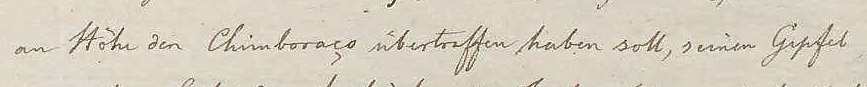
an Höhe den Chimboraço übertreffen haben soll, seinen Gipfel
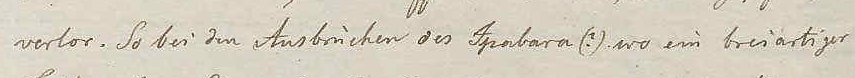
verlor. So bei den Ausbrüchen des Ipabara wo ein breiartiger
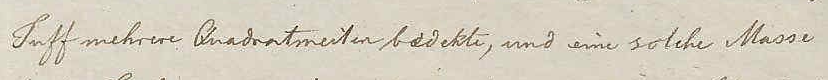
Tuff mehrere Quadratmeilen bedekte, und eine solche Masse
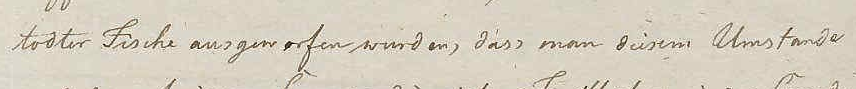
todter Fische ausgeworfen wurden, dass man diesem Umstande
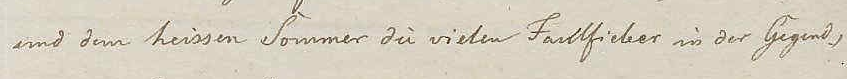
und dem heissen Sommer die vielen Faulfieber in der Gegend,
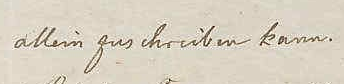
allein zuschreiben kann.
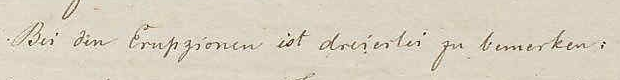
Bei den Erupzionen ist dreierlei zu bemerken:
